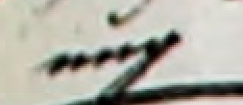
Forst„ schätzung
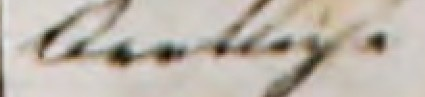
Vertliche
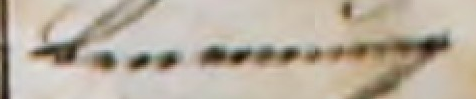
Benennung
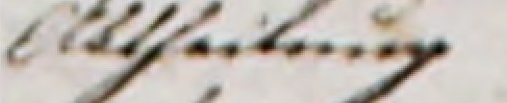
Abtheilung
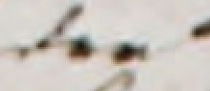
der
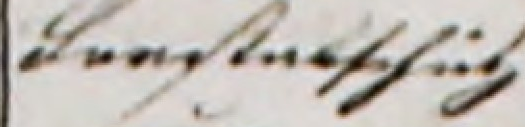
Forstabschätz
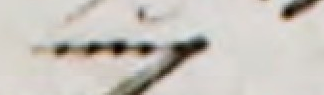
ung
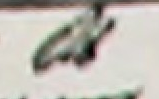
Ab
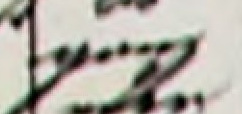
ganz
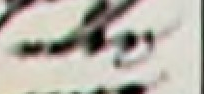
oder
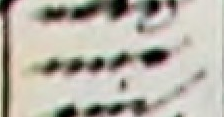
nur
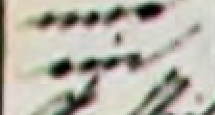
ein
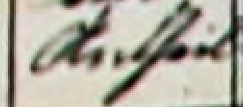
Antheil
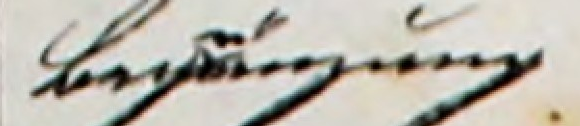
Begränzung
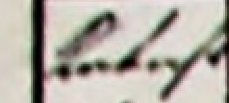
Katast
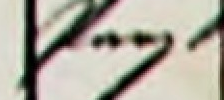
Parz.
